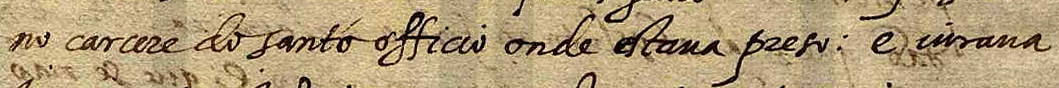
no carcere do santo officio onde estaua preso: e iuraua
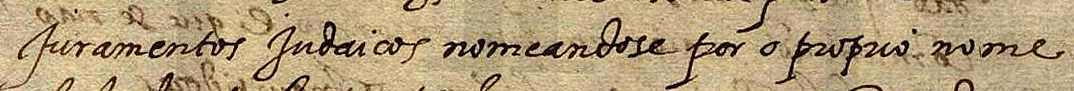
Juramentos Judaicos nomeandose por o proprio nome
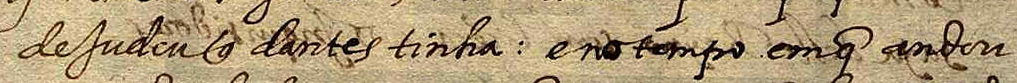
de Judeu q̄ dantes tinha: e no tempo. em q̄ andou
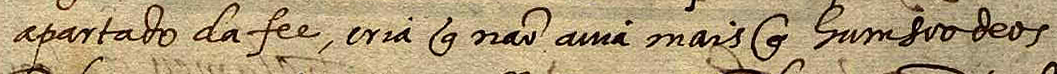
apartado da fee, cria q̄ naõ auia mais q̄ hum soo deos
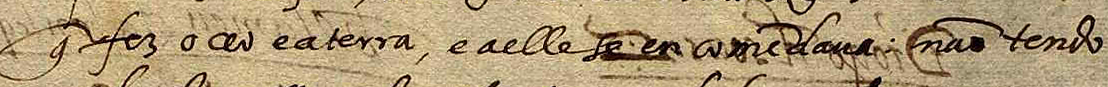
q̄ fez o çeo e a terra, e a elle se encomēdaua: não tendo
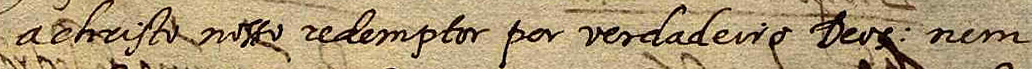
a christo nosso redemptor por verdadeiro Deos: nem
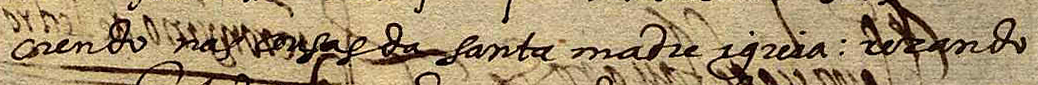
crendo nas cousas da santa madre igreia: rezando
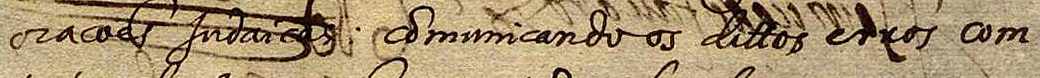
oracoēs Judaicas: cōmunicando os dittos erros com
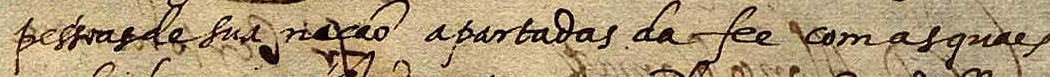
pessoas de sua naçaõ apartadas da fee com as quaes
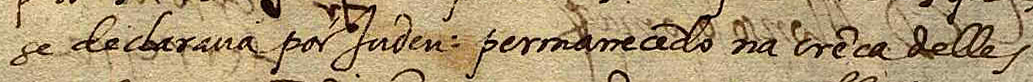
se declaraua por Judeu: permanecēdo na crēca delles
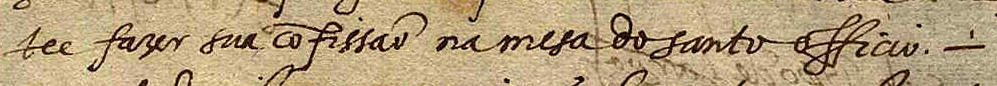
tee fazer sua cōfissaõ na mesa do santo officio. -
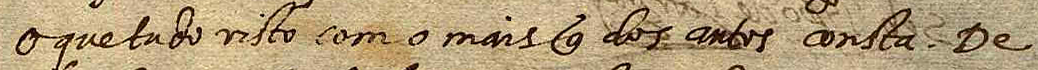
o que tudo visto com o mais q̄ dos autos consta. De
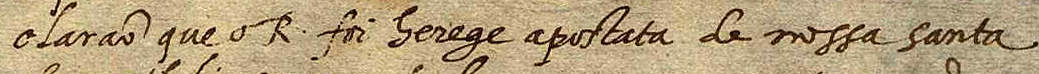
claraõ que o R. foi herege apostata de nossa santa
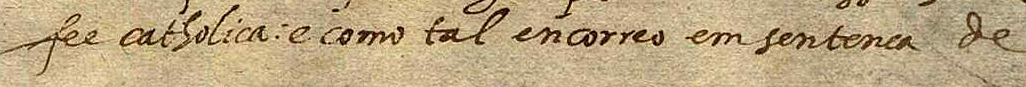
fee catholica: e como tal encorreo em sentenca de
